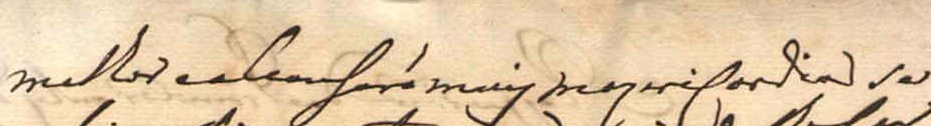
melhor, e alcansará mais meseriCordia se
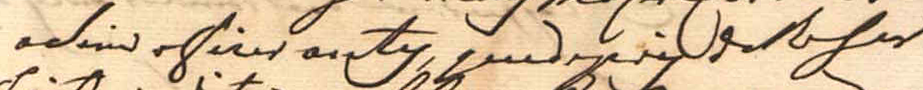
asim o fizer antes, que depois de lhe ser
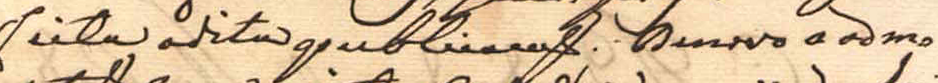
feita a dita publicaçaõ. De novo a admo
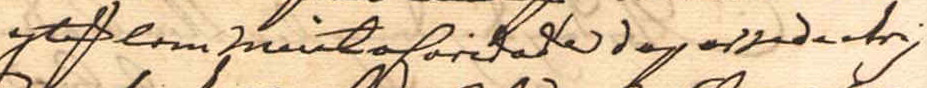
estaõ com muita Caridade da parte de chris
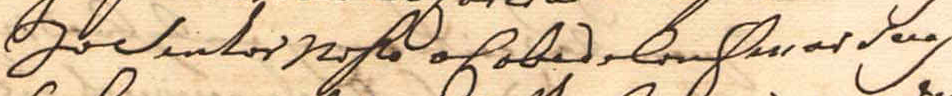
to Senhor nosso aCabe de Confessar suas
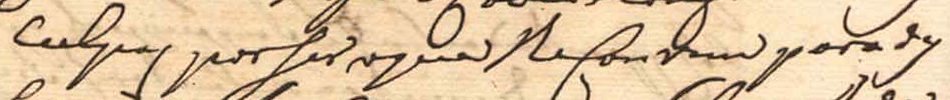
Culpas por ser o que lhe Convem para des
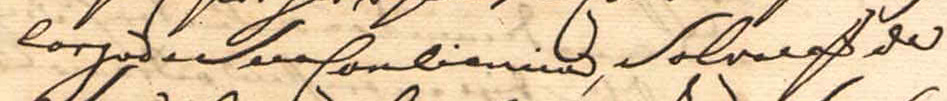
cargo de Sua Conciencia, Salvaçaõ de
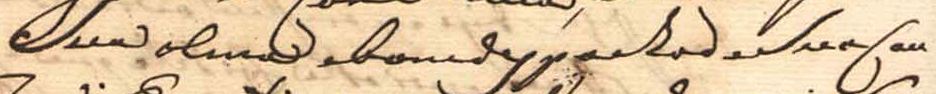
Sua alma, e bom despacho de Sua Cau
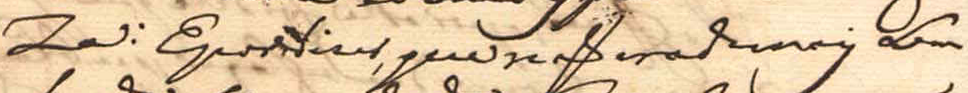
Za: E por dizer, que naõ era de mais Lem
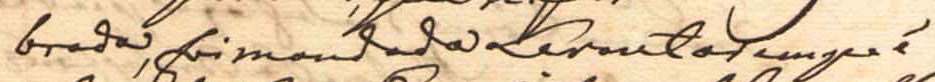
brada, foi mandada Levantar em peé
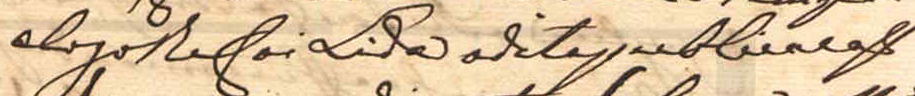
e logo lhe foi Lida a dita publicaçaõ
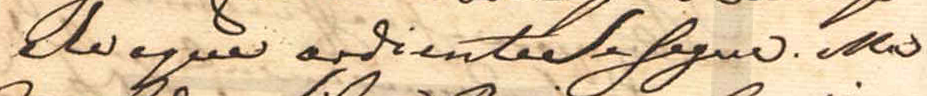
e he o que ao diante Se segue. Ma
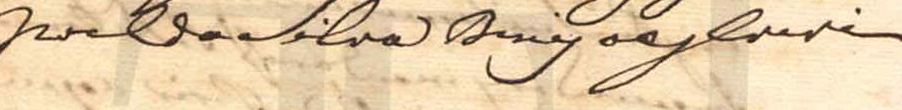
noel da Silva Dinis o esCrevi
